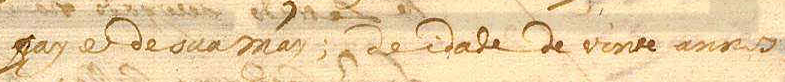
pay e de sua may; de idade de vinte annos,
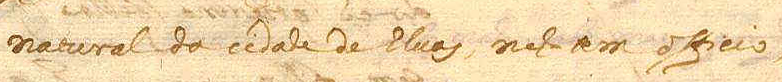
natural da cidade de Eluas, naõ tem officio,
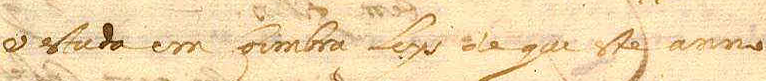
e estuda em Coimbra Leys de que este anno
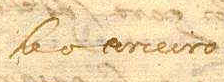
he o terceiro.
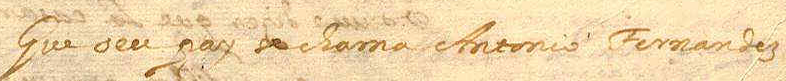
Que seu pay se chama Antonio Fernandez
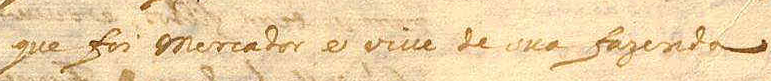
que foi mercador e viue de sua fazenda
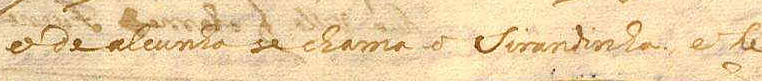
e de alcunha se chama o Sirandinha. e he
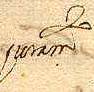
juramto
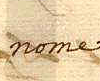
nome
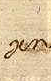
xn
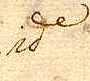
ide
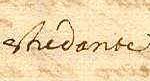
estudante
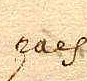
paes
